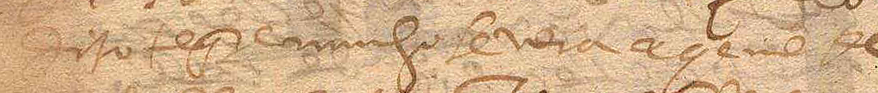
dito testemunho se vera a qe me Re
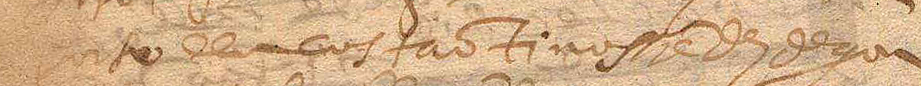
porto e eu costaõtino Mēdes de gou
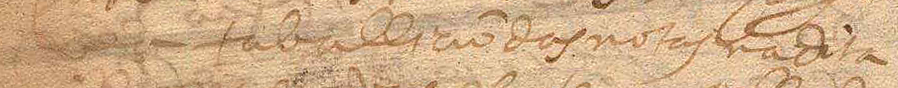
vea taballiaõ das notas na dita
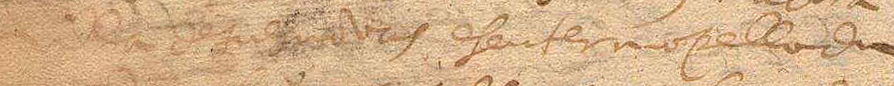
villa de tores nouas e seu termo pello du
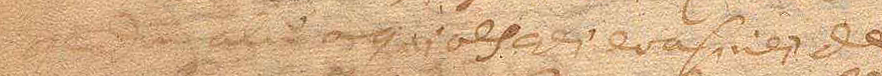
qe dom aluo aqui o escrevi e o asinei de
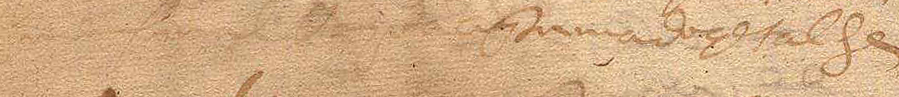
meu sinal R_ custumado qe tal he
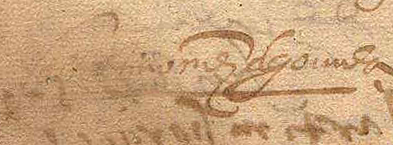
tino m̄ez dgouuea
